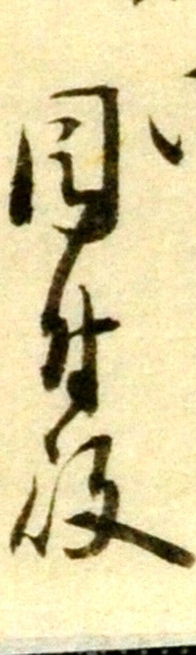目付役
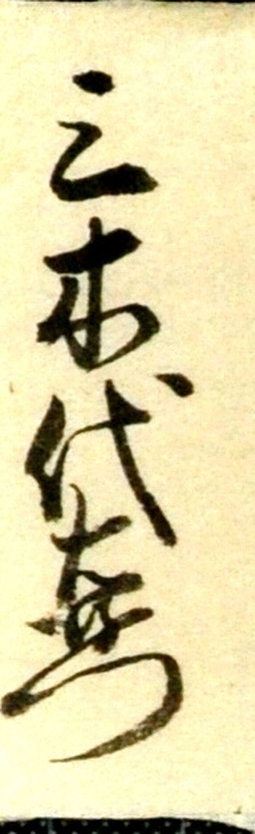三木代右衛門

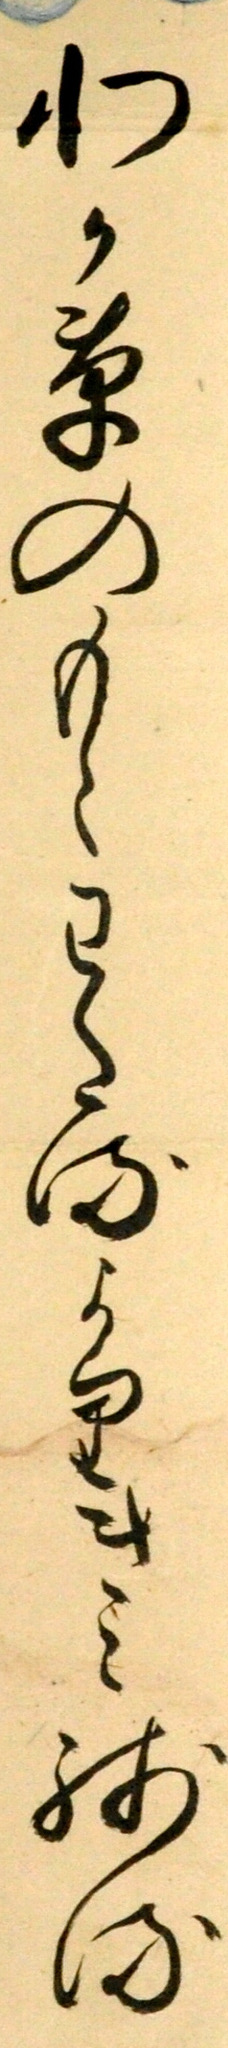わか草のもとわたるよりきこ残る
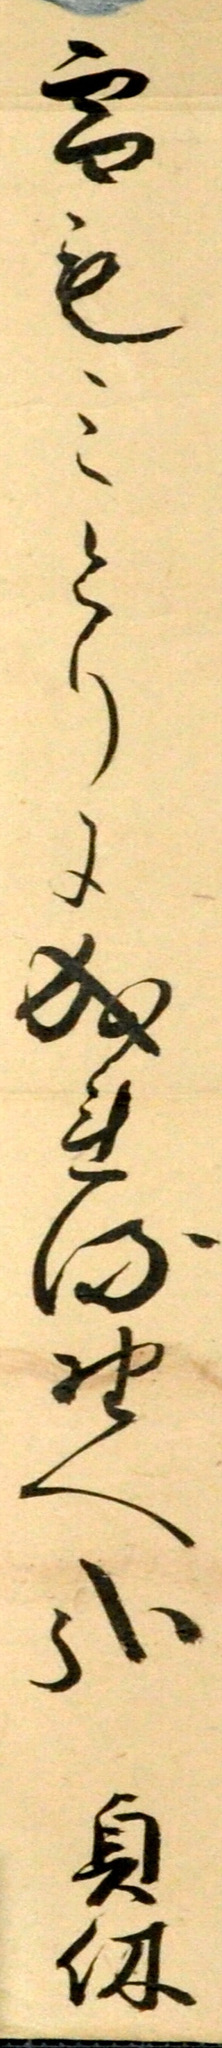雪もみとりに成れる野へ哉貞休

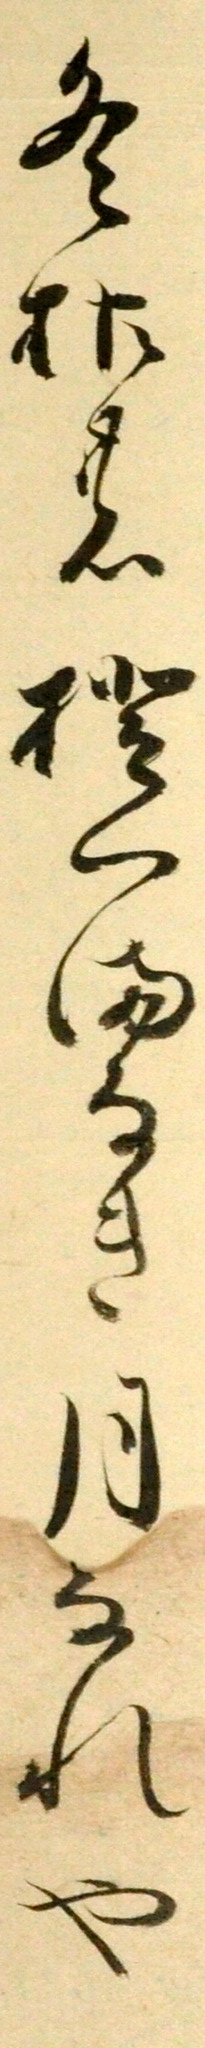冬枯の梢くまなき月なれや
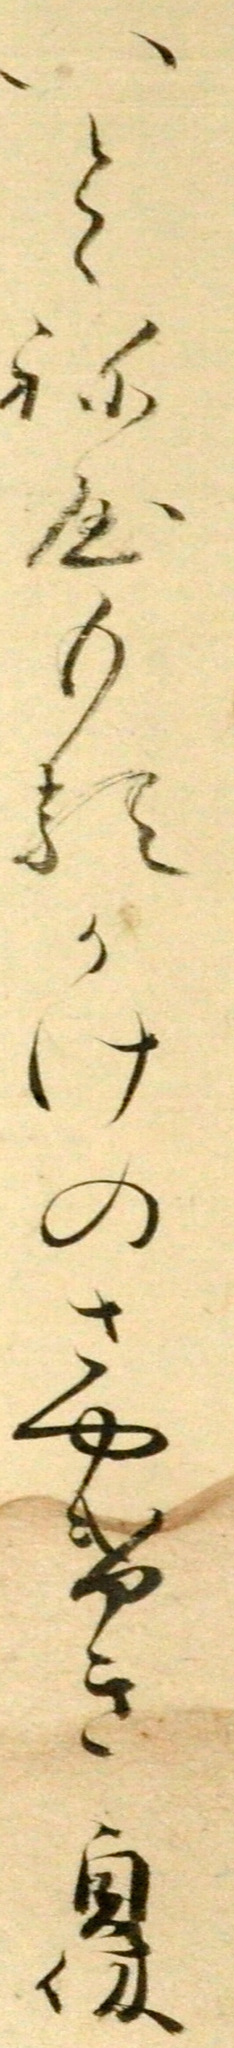いとゝねやもるかけのさやけき貞休

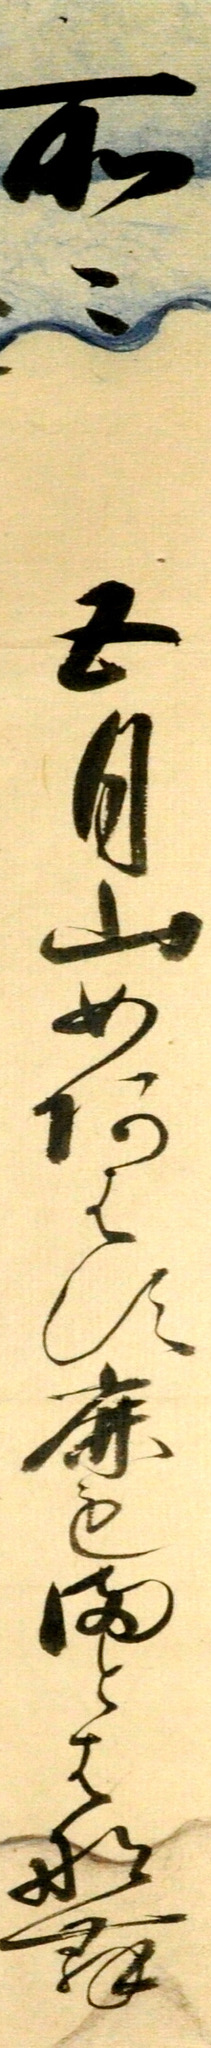五月山めあはす鹿もまとはなむ
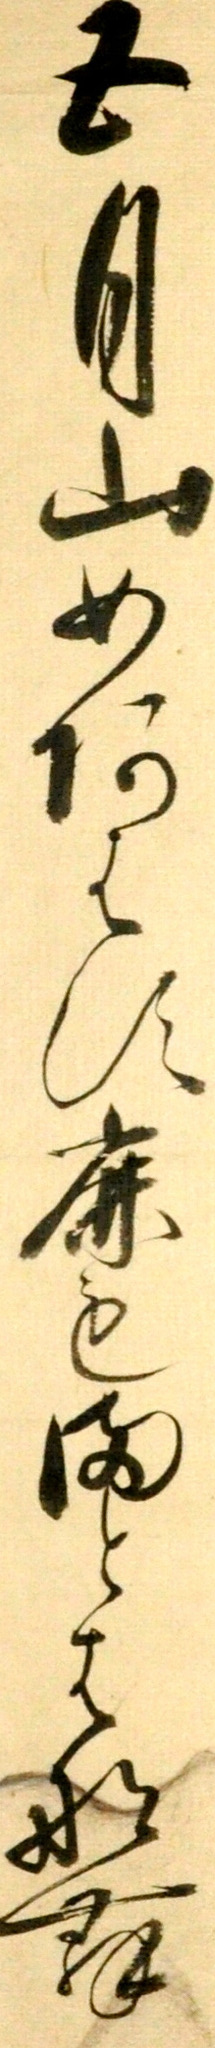五月山めあはす鹿もまとはなむ
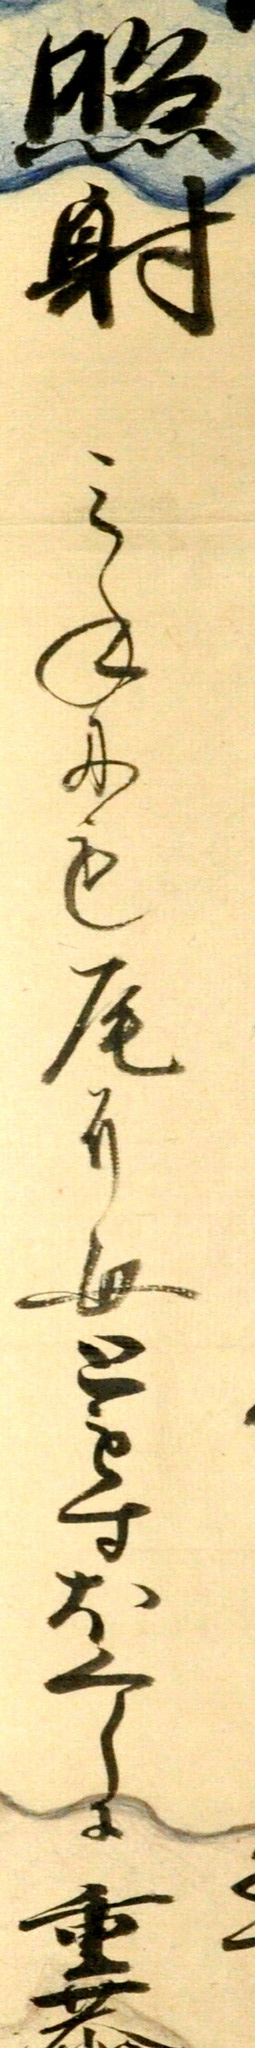みねにも尾にもともすほくしに重恭

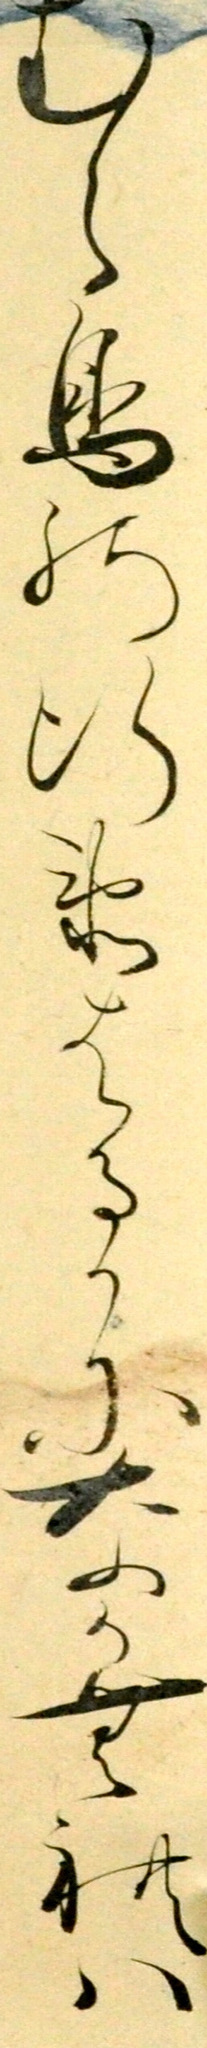むら鳥の行衛はるかになかむれは
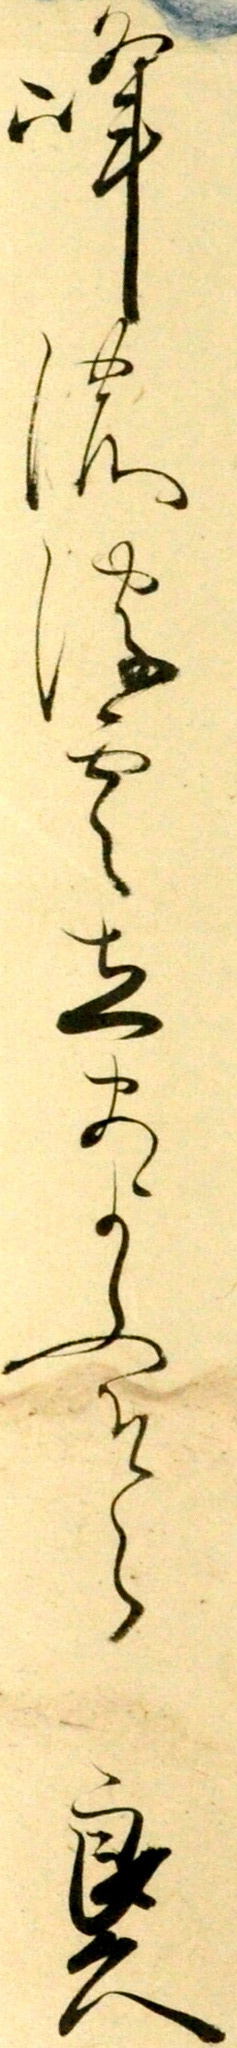峰の波雲立まよふそら良久

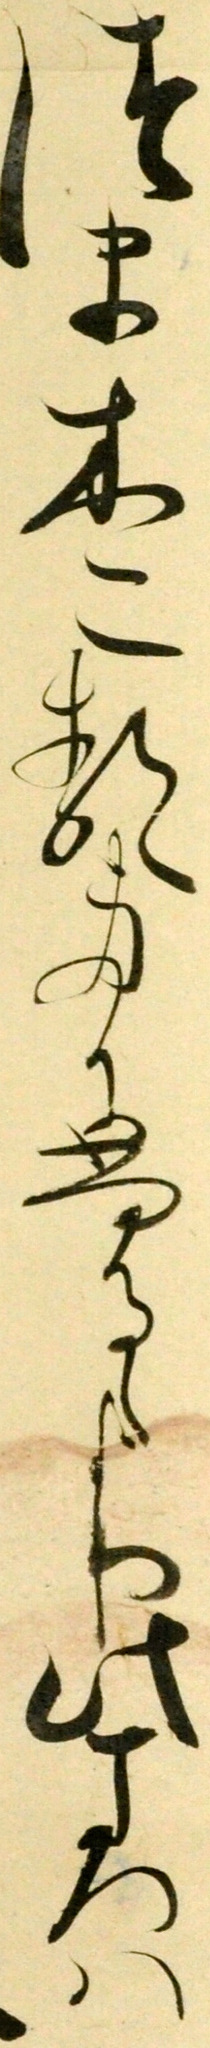つま木こる身にふるゝより此ころは
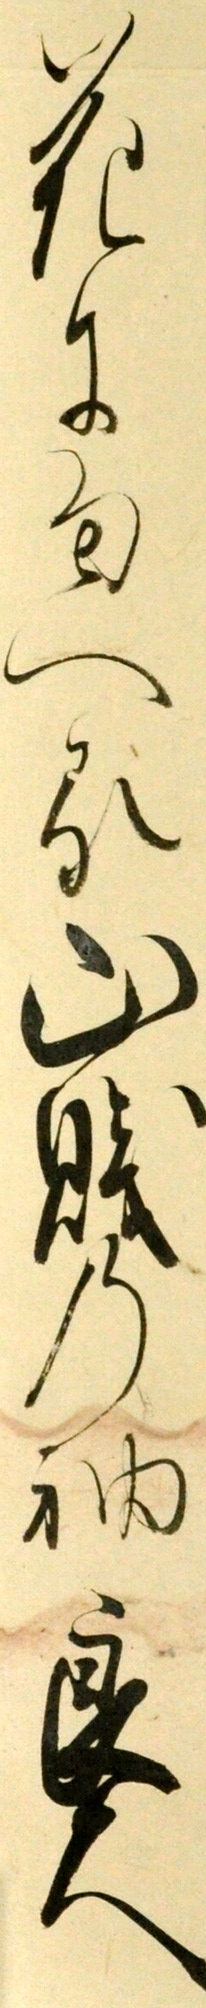花に匂へる山賤の袖良久
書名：短冊
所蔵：伊那市立高遠町図書館・合同会社AMANE
